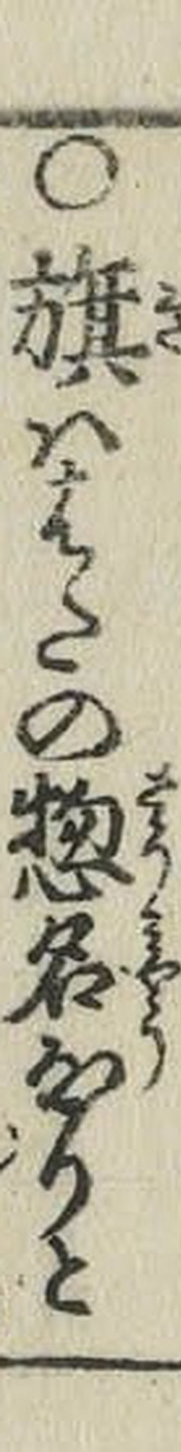○旗ははたの惣名なりと
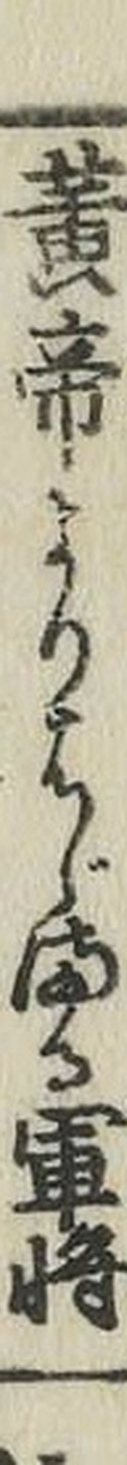黄帝よりはじまる軍将
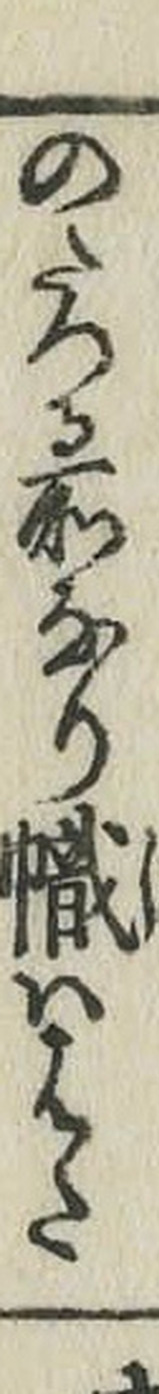のたつる所なり幟ははた
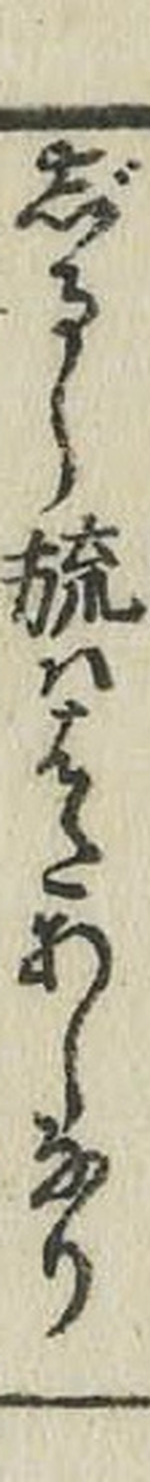じるし旒ははたあしなり
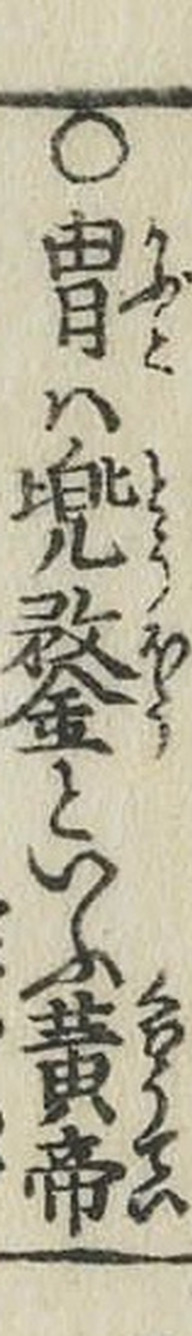○冑は兜鍪といふ黄帝
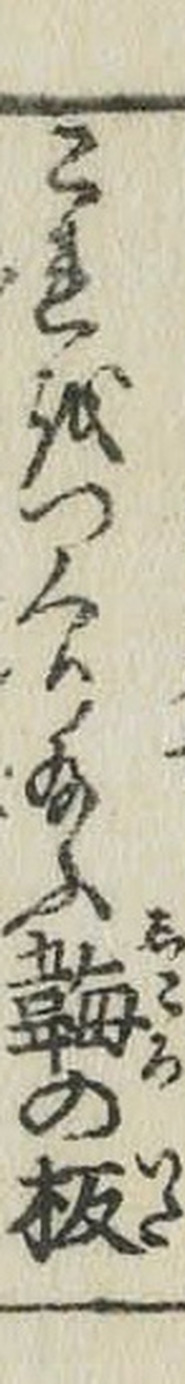これをつくり給ふ𩊱の板
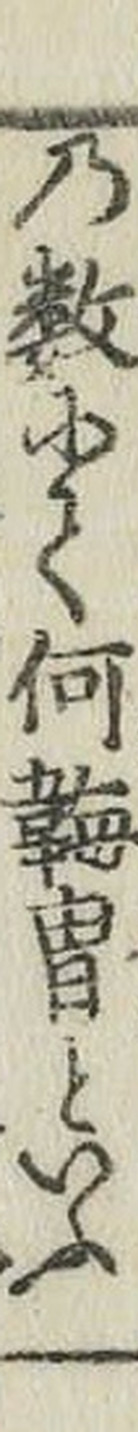の数にて何𩊱冑といふ
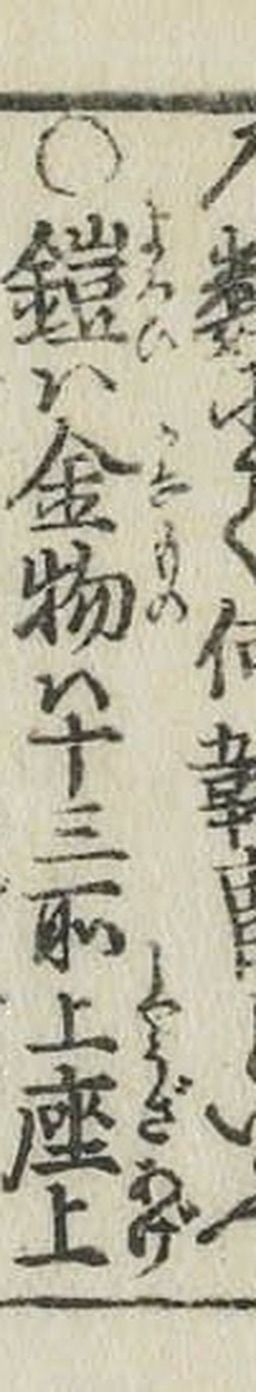○鎧は金物は十三所上座上
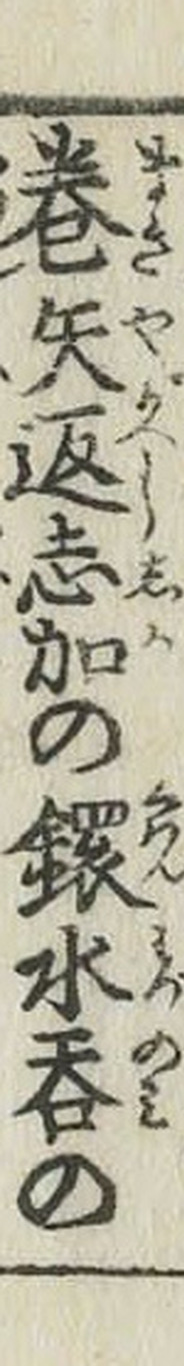巻矢返志加の鐶水呑の
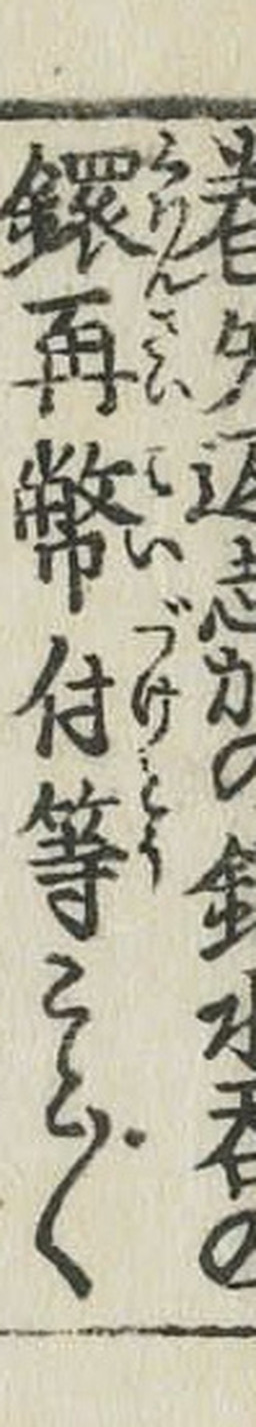鐶再幣付等こと〴〵
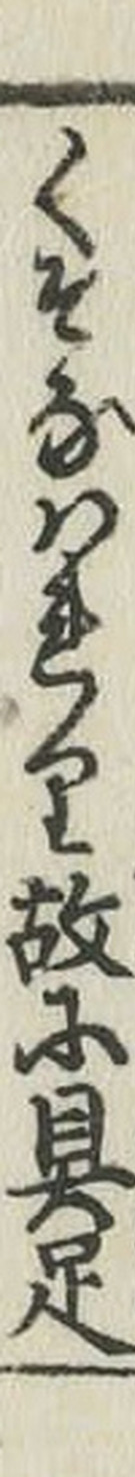くそなはれり故に具足
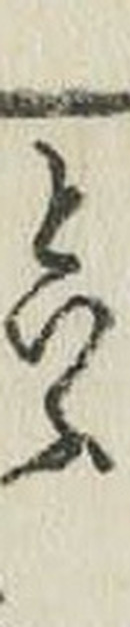といふ
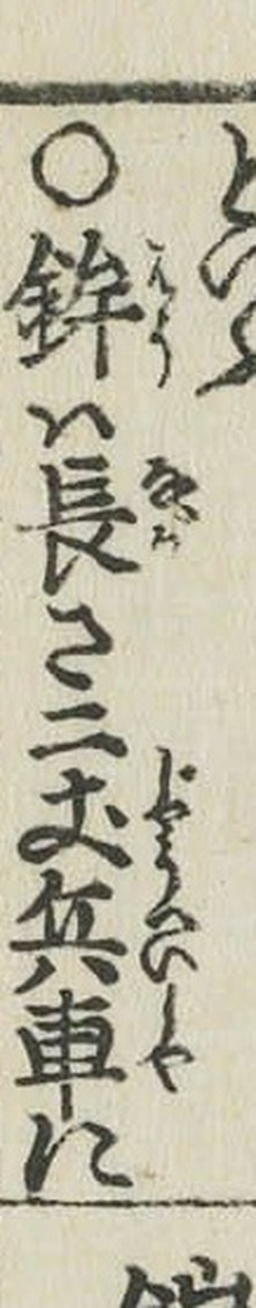○鉾は長さ二丈兵車に
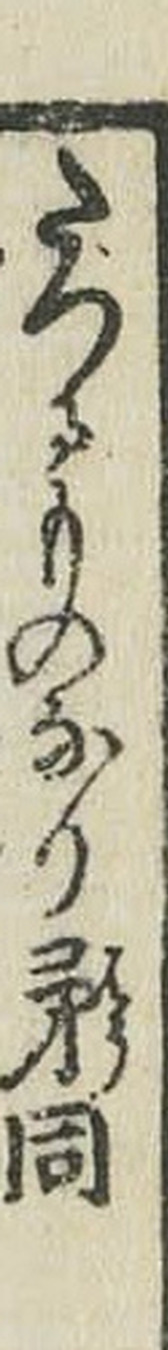たつるものなり矛同
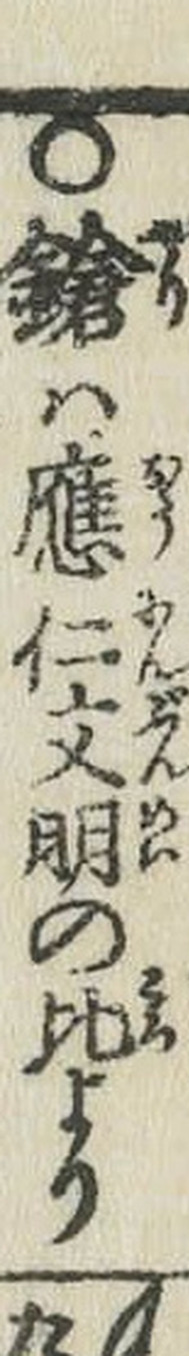○鎗は応仁文明の比より
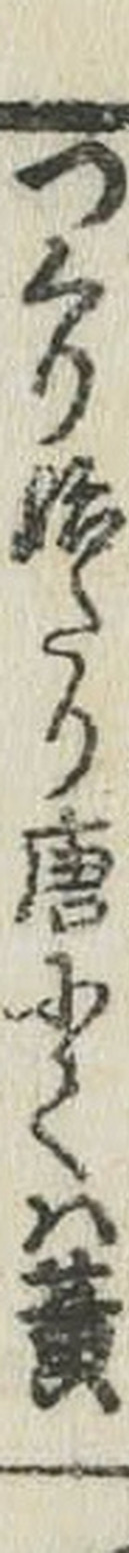つくり始たり唐にては黄
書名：増補頭書訓蒙図彙大成 10巻 5:巻之9-11
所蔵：東京学芸大学教育コンテンツアーカイブ
